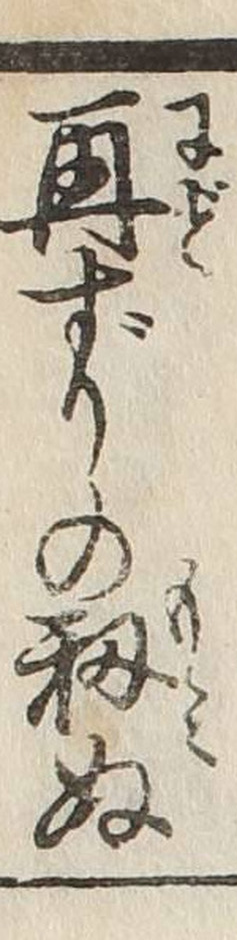再ずりの籾ぬ
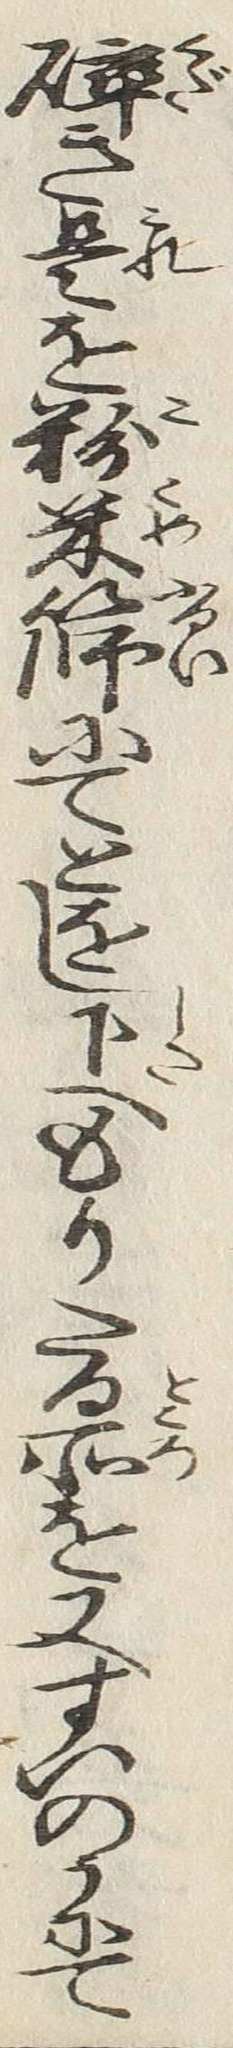砕き是を粉米篩にてとをし下へもりたる所を又すいのうにて
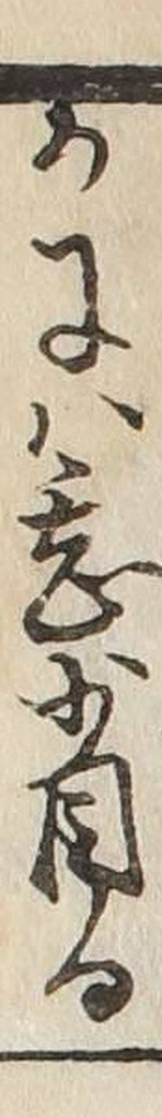かには甚省る
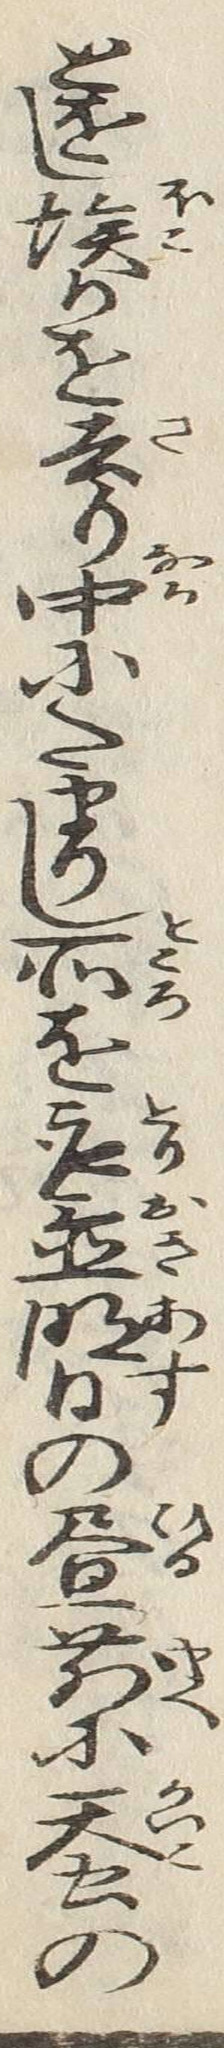とをし埃りを去り中にたまりし所を取置明日の昼前に蚕の

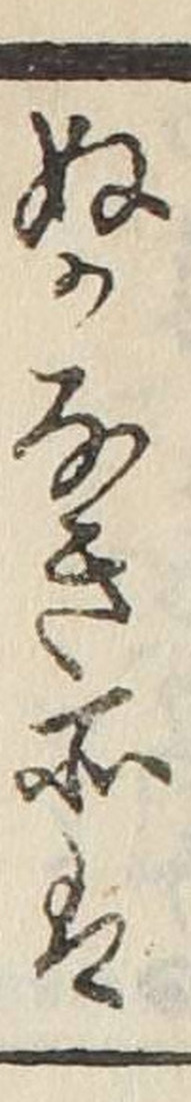ぬかなき所は
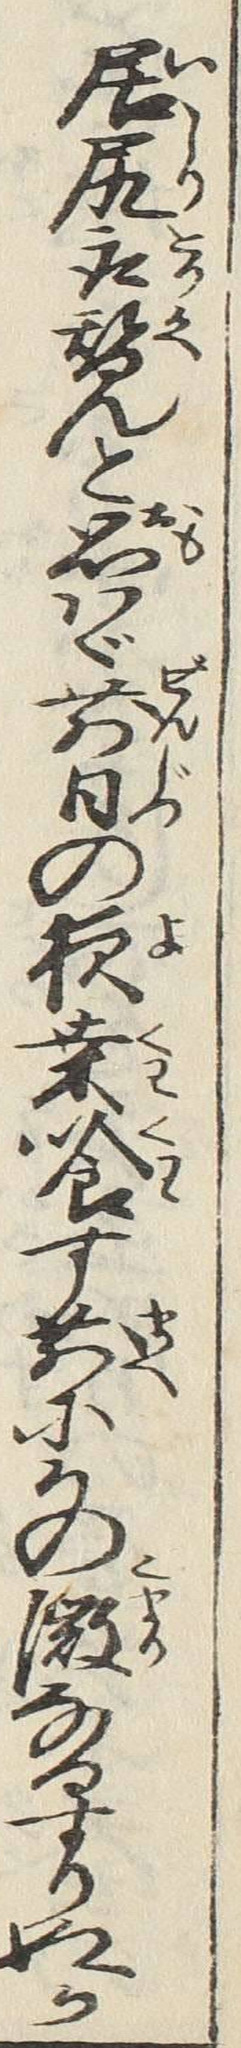居尻取替んと思はゞ前日の夜桑喰す前にかの微なるすりぬか
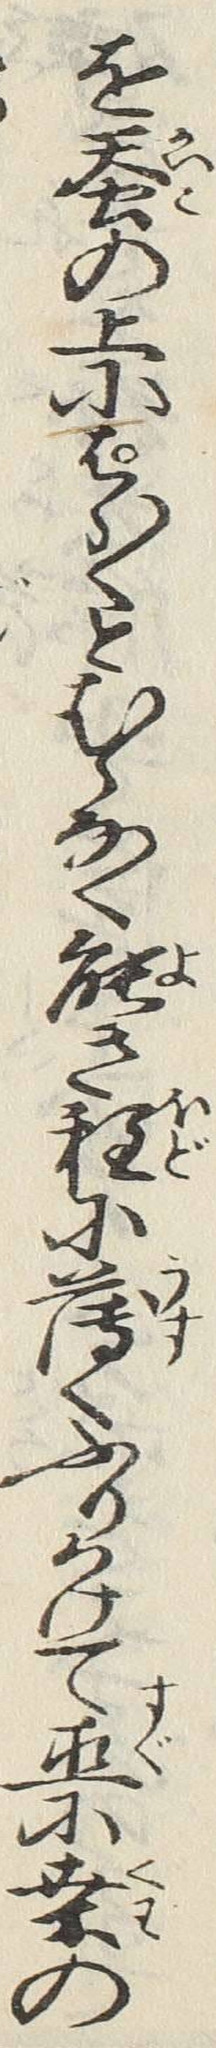を蚕の上にぱら〳〵とむらなく能き程に薄くふりかけて直に桑の
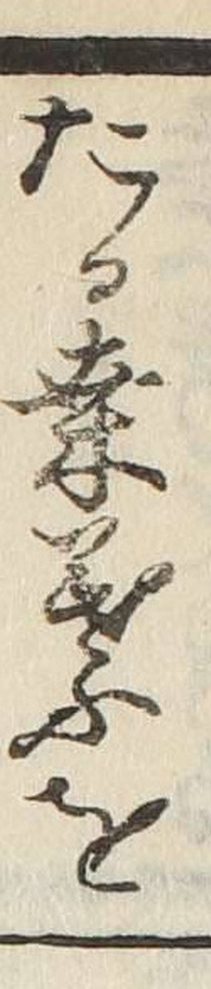たる桑葉を
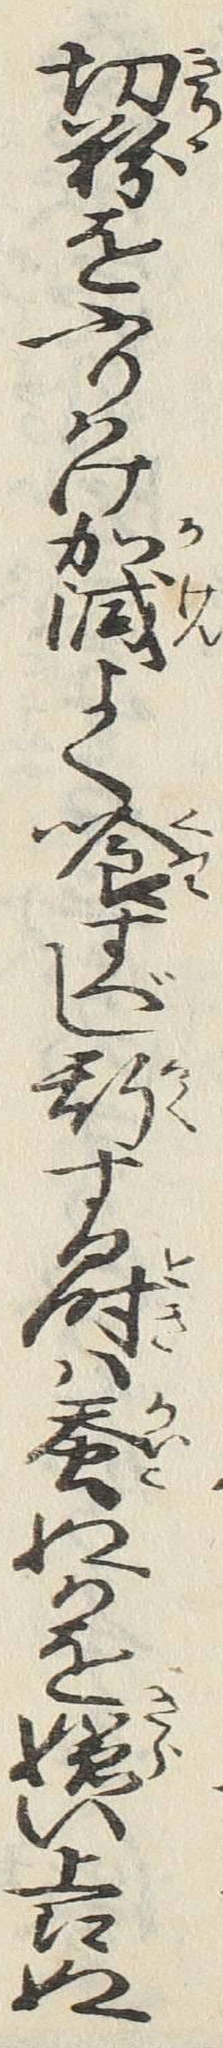切粉をふりかけ加減よく喰すべし斯する時は蚕ぬかを嫌い上えぬ
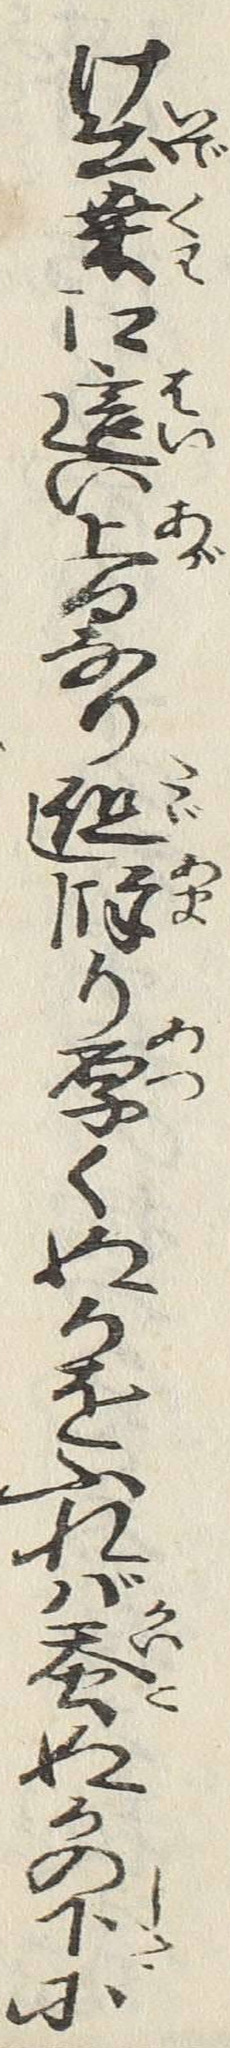け出桑え這い上るなり但し餘り厚くぬかをふれば蚕ぬかの下に
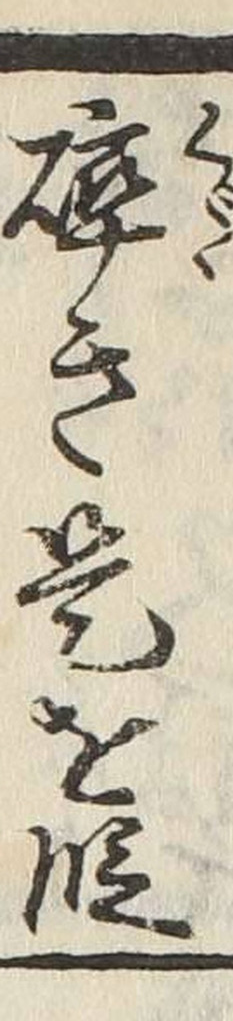碎き是を段
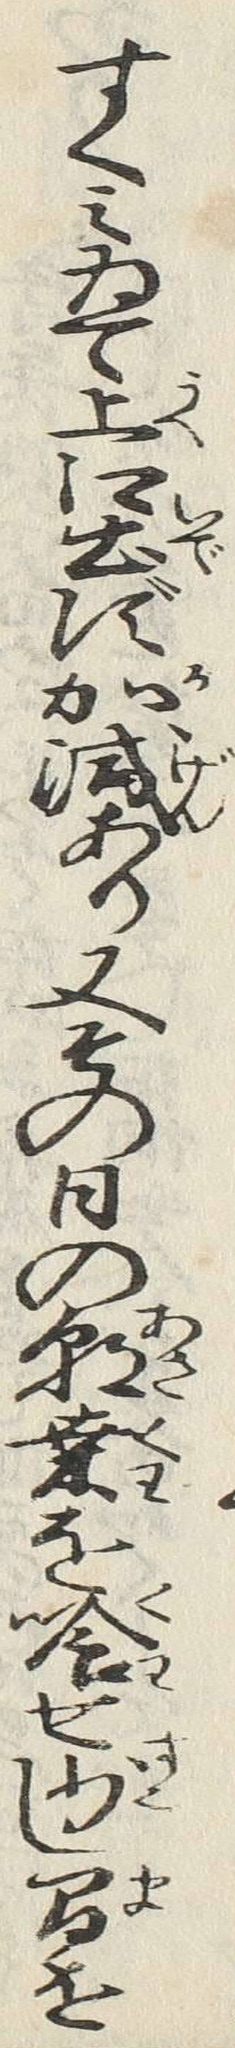すくみゐて上え出ず加減あり又その日の朝桑を喰せ少し間を
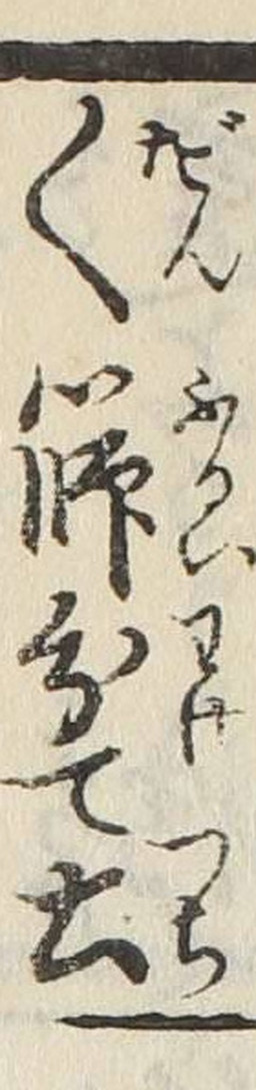〳〵篩分て土
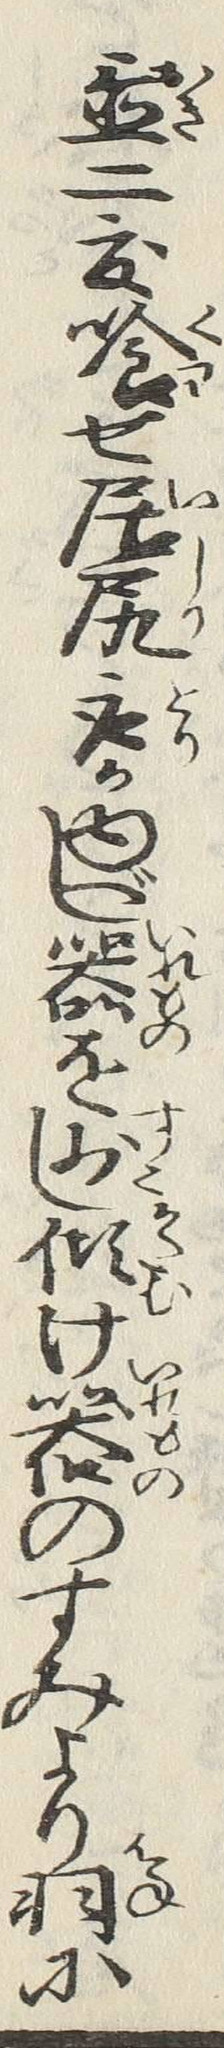置二度喰せ居尻取かゆべし器を少し傾け器のすみより羽に
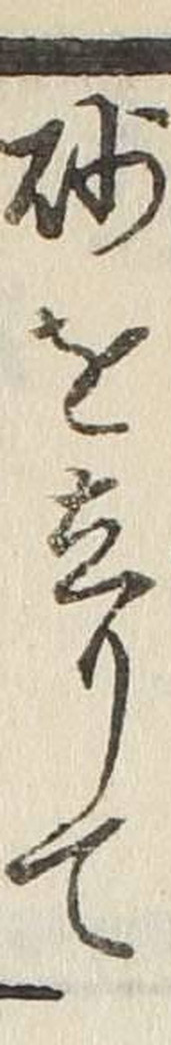砂を去りて
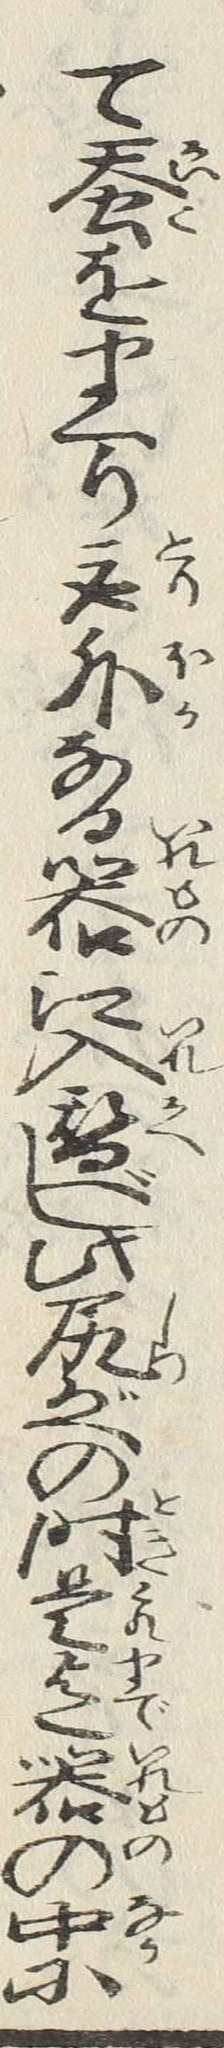て蚕をまくり取外なる器え入替べし此尻がへの時是迄器の中に
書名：養蠶實驗録
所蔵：東京大学農学生命科学図書館 国文学研究資料館
